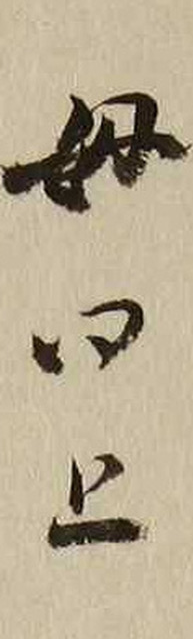母同上
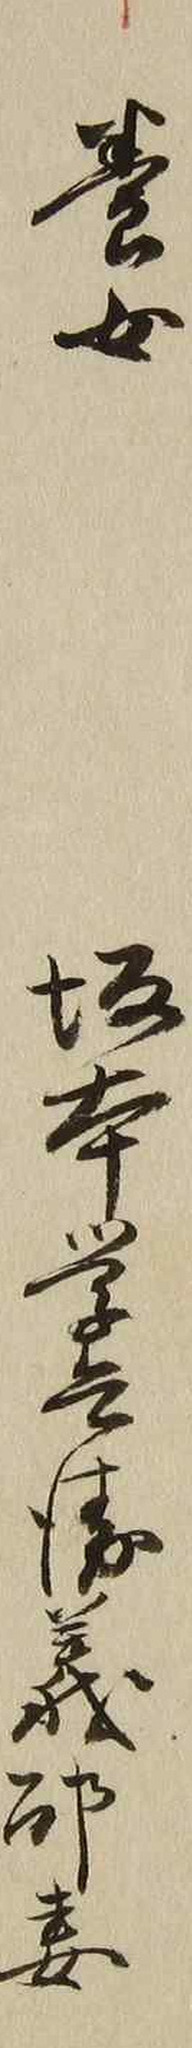養女坂本学兵衛義邦妻
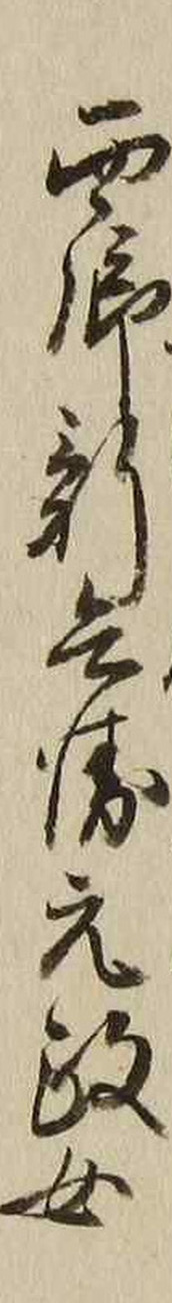実西郷新兵衛元政女
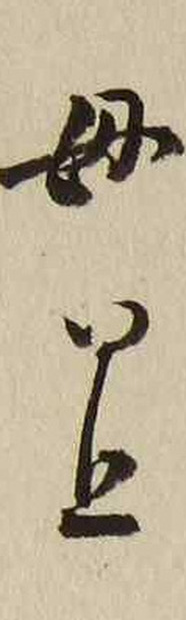母同上

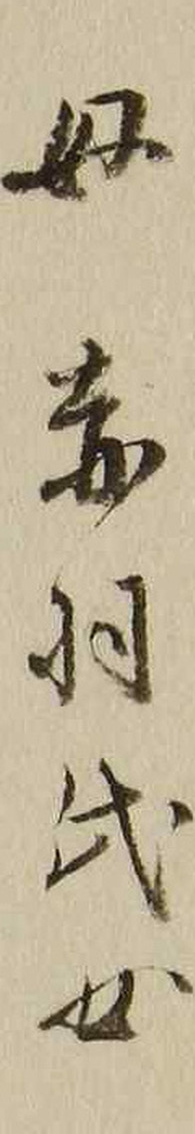母赤羽氏女
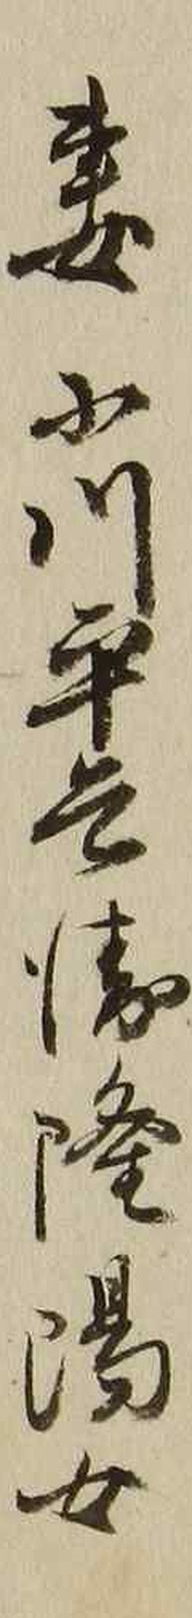妻小川平兵衛隆陽女
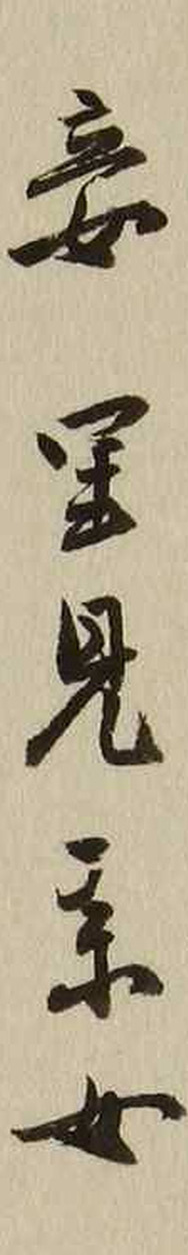妻里見系女
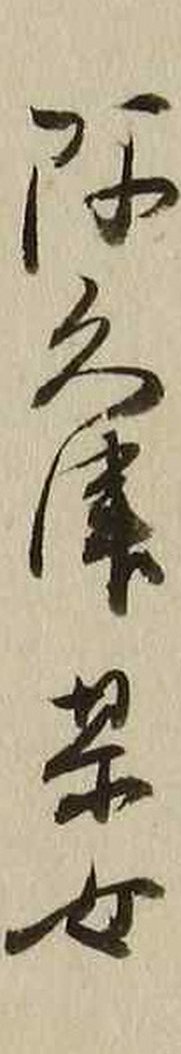阿久津某女
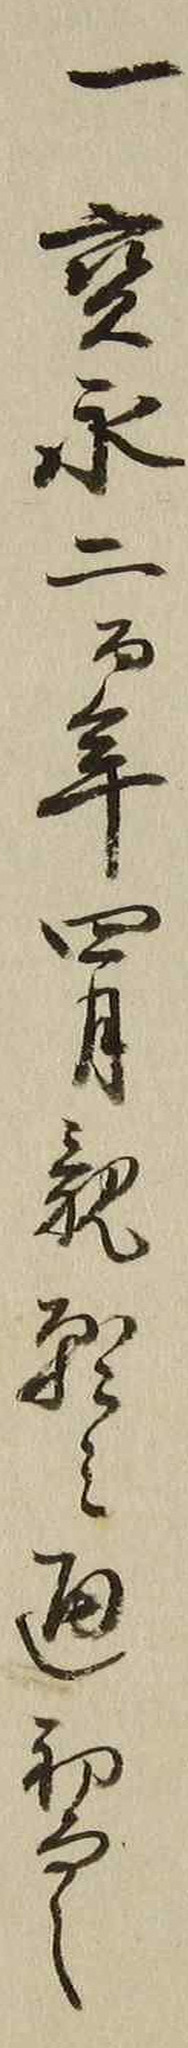一宝永二酉年四月親願之通初而之
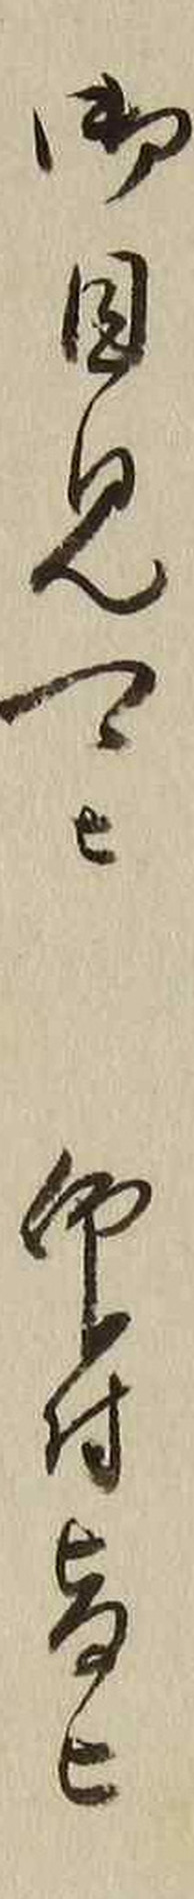御目見可被仰付旨被
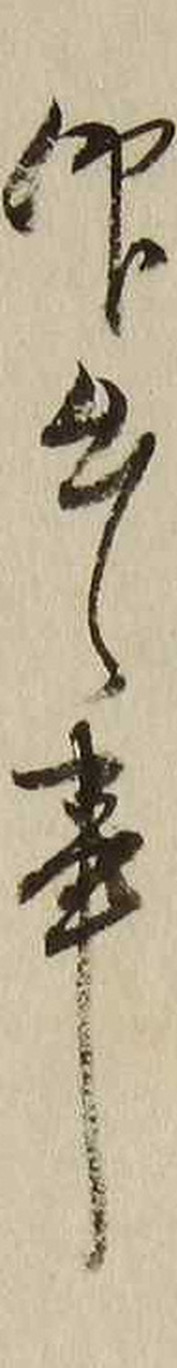仰出候事
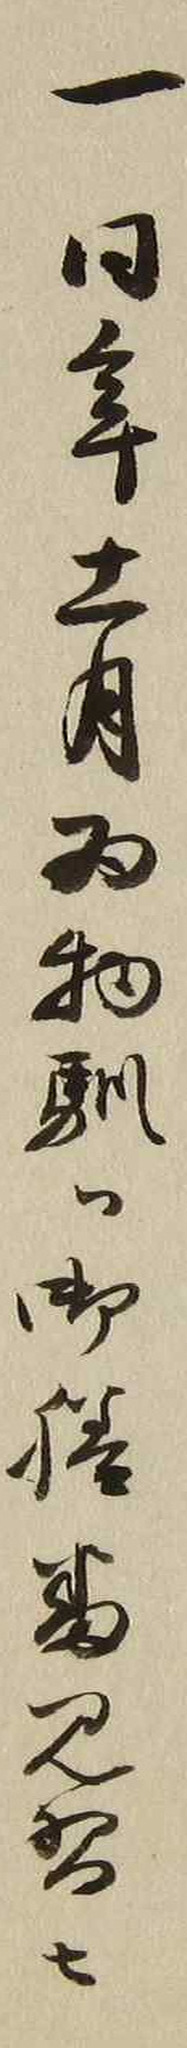一同年十一月為物馴候御膳番見習被
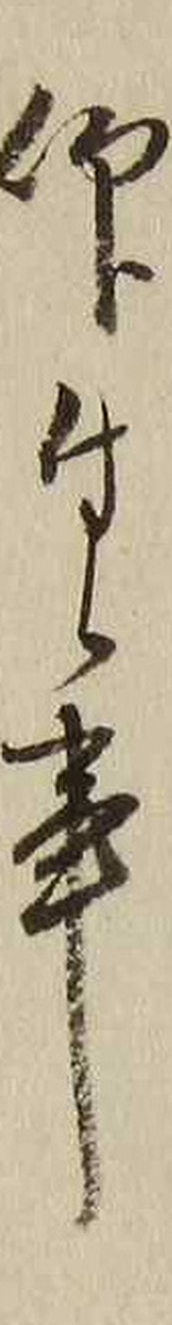仰付候事
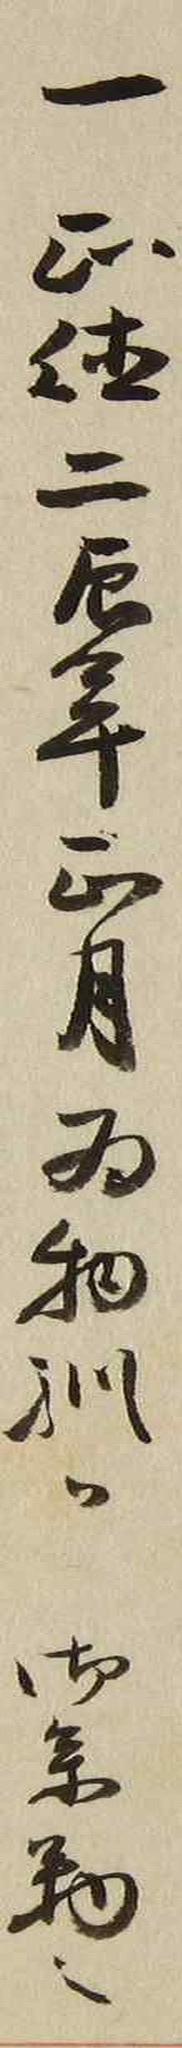一正徳二辰年正月為物馴候御参勤之
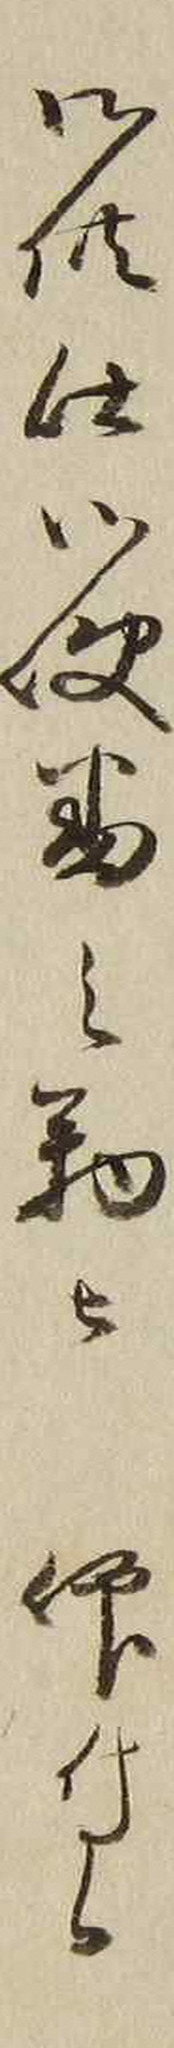御供仕御使番之勤被仰付候
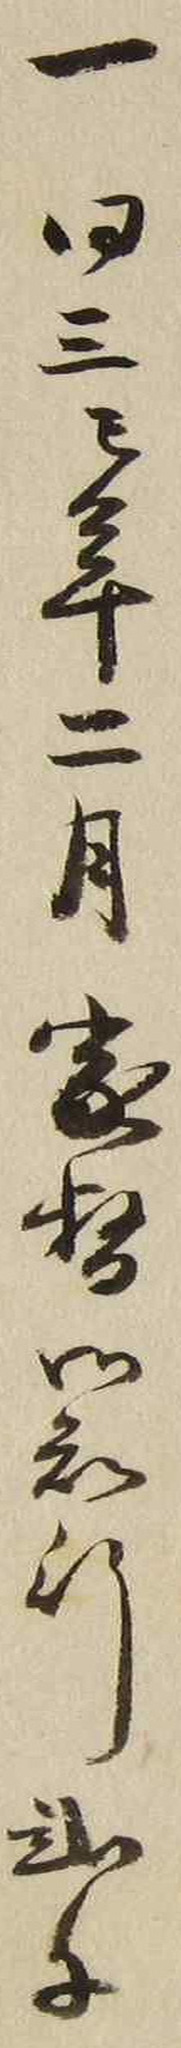一同三巳年二月家督御知行弐千
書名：諸士系譜　巻之269　さ之部1
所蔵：会津若松市立会津図書館
